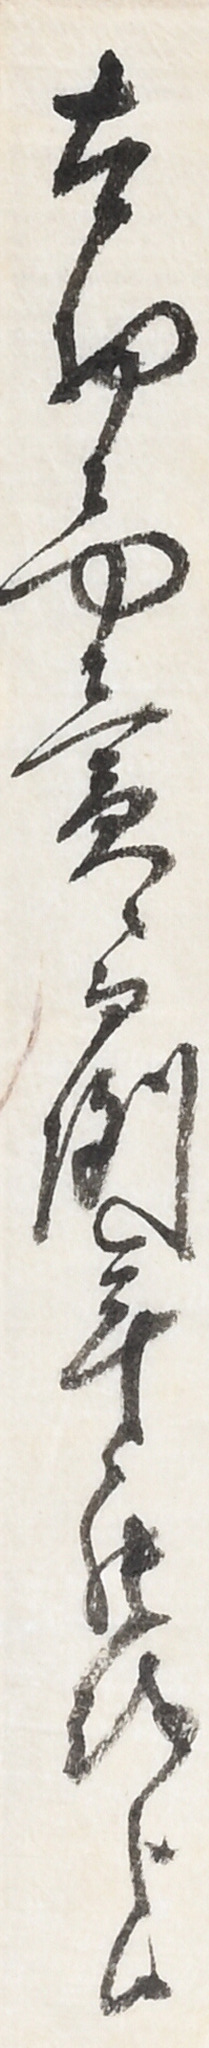太物商売ニ而例年罷越申候
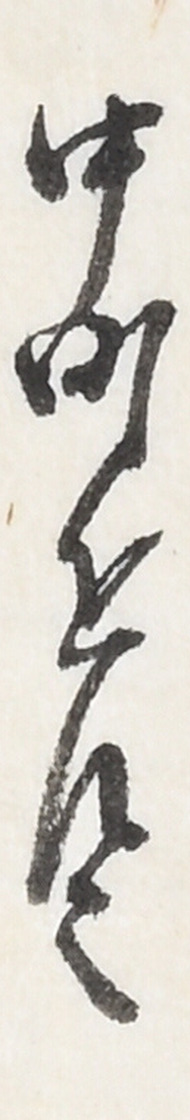中町近江や
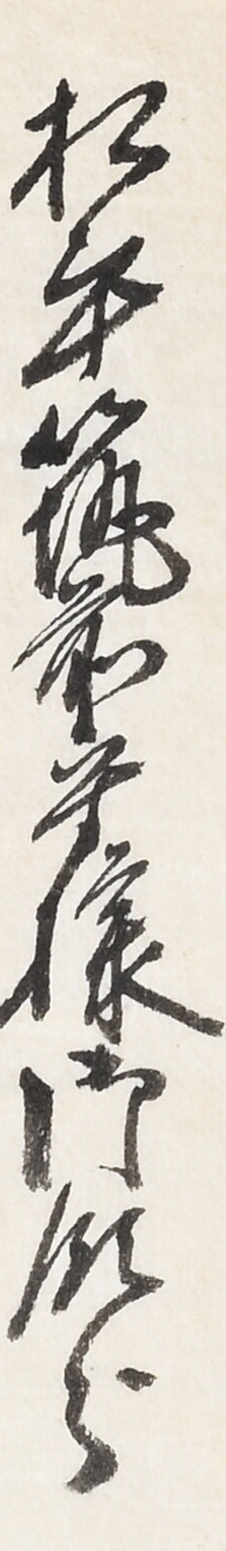松平筑前守様御領分
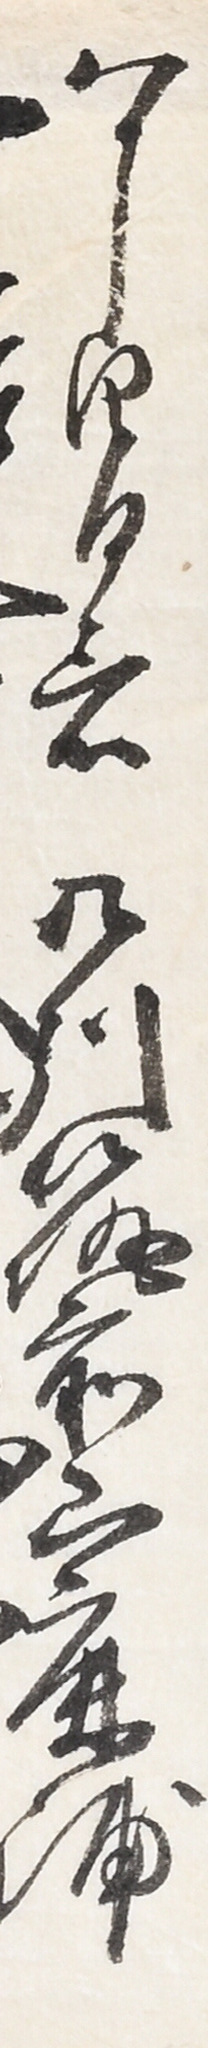八月四日着九州筑前山鹿浦
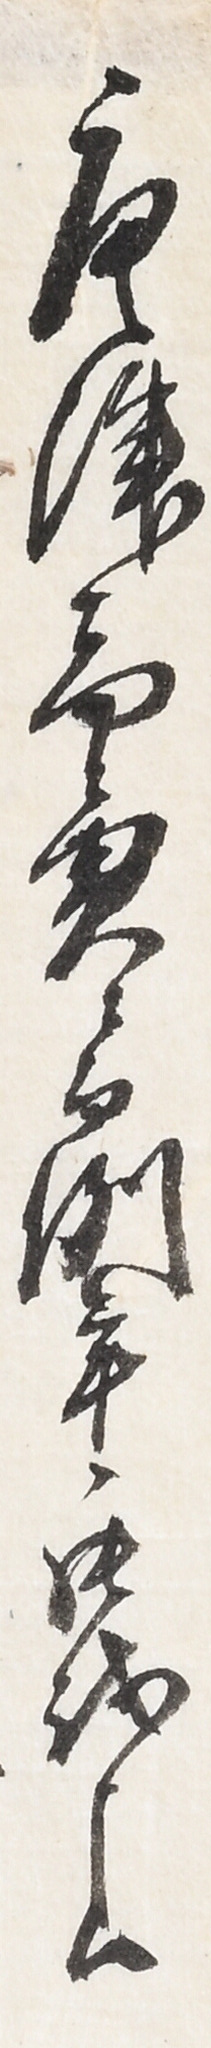唐津商売ニ而例年罷越申候
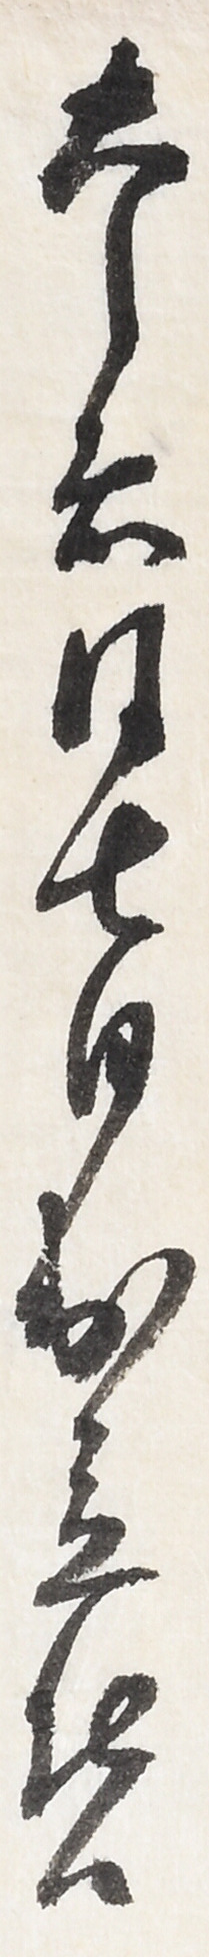右之者同七日出立仕候
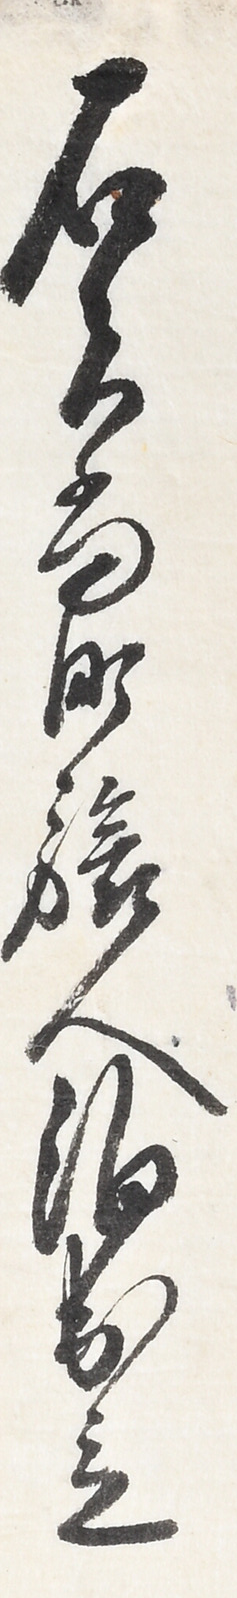右者当町旅人泊出立
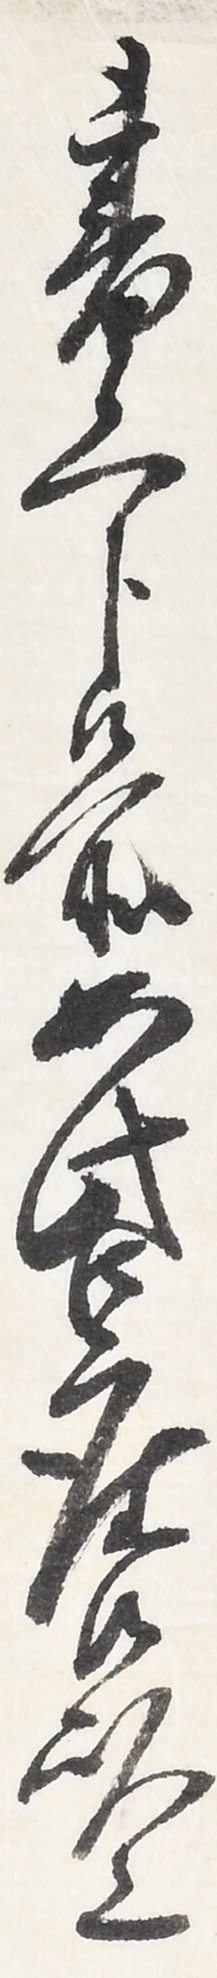書上申候所如此御座候以上
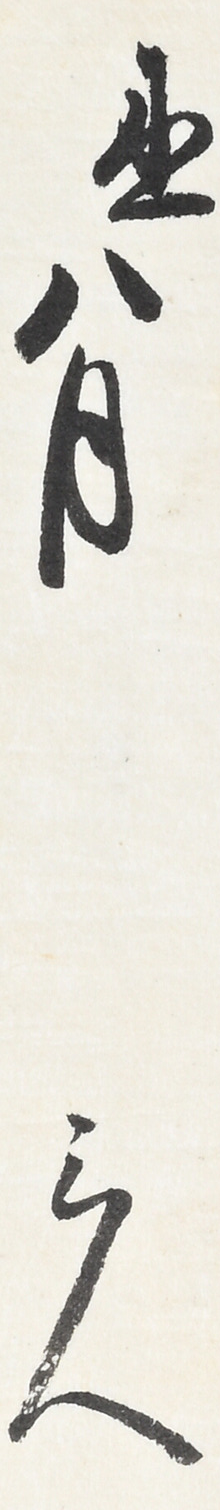丑八月三人
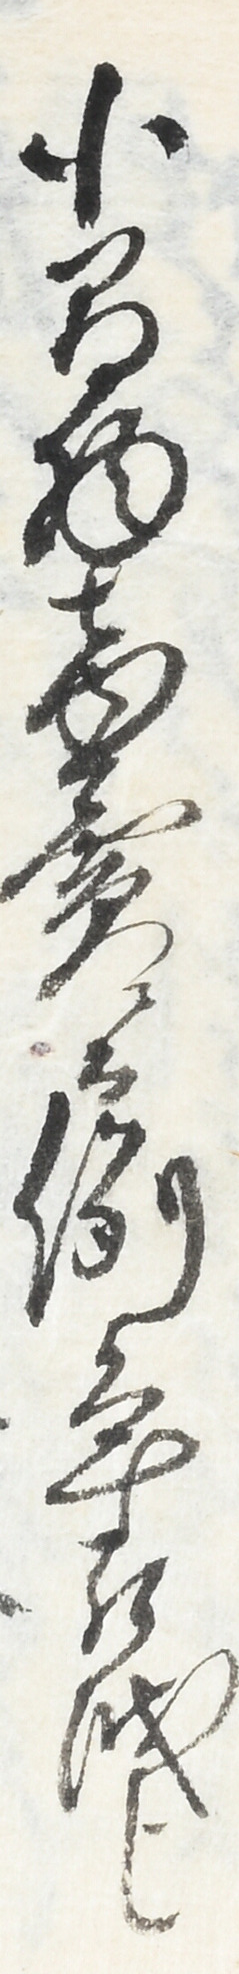太物商売ニ而例年罷越申候
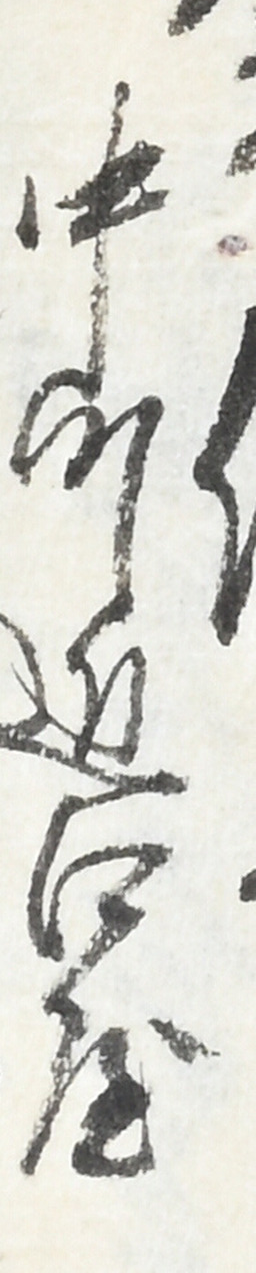中町近江や

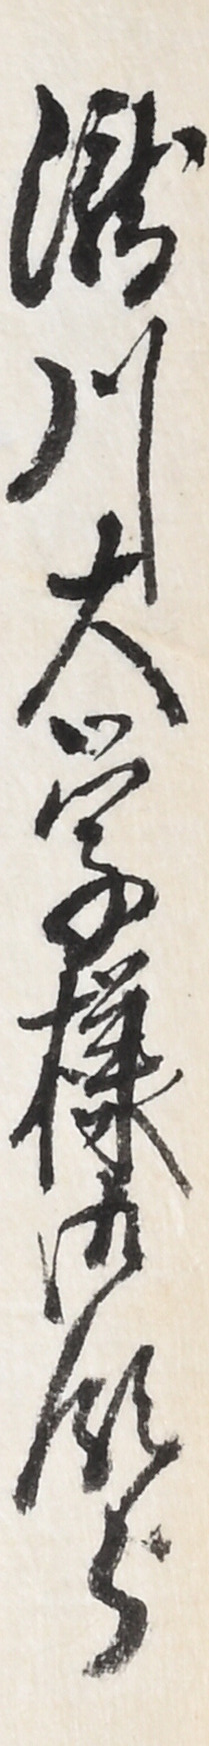瀧川大学様御領分
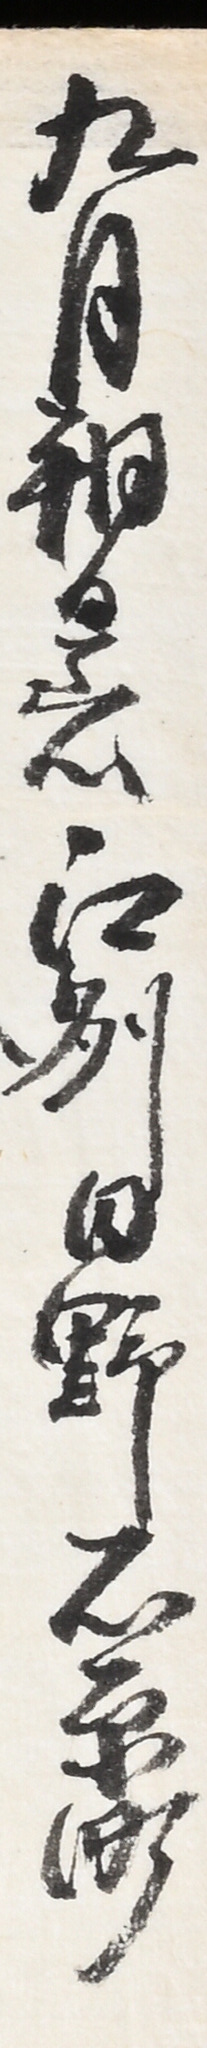九月朔日着江州日野石原町
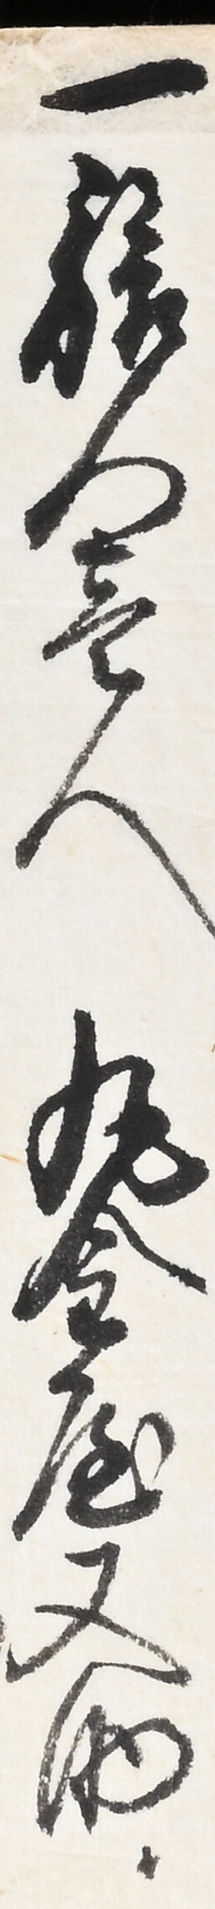一旅人壱人丸金屋又助・
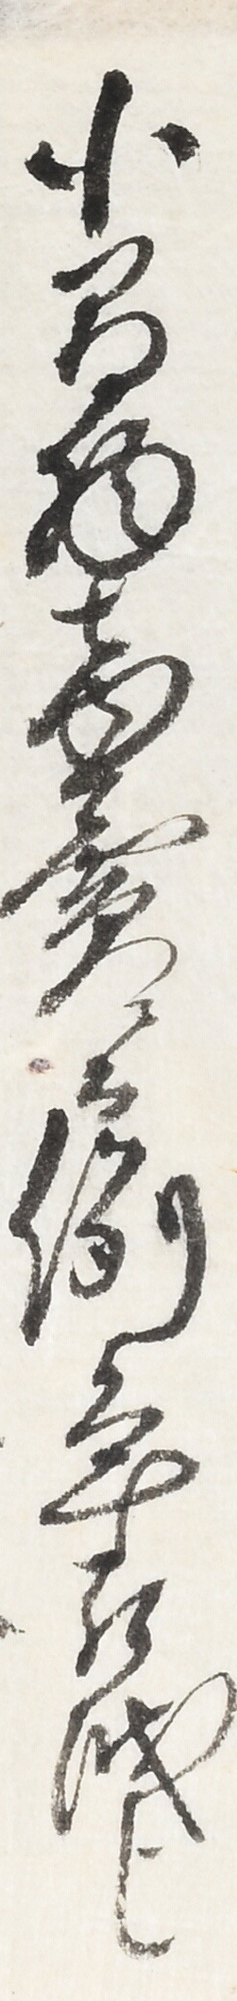小間物商売ニ而例年罷越申候
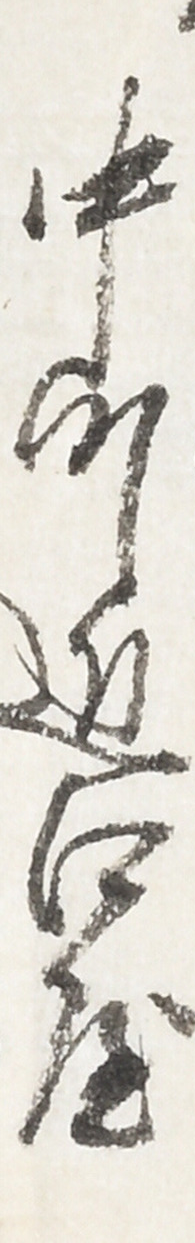中町近江屋
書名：旅人泊控帳
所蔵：伊那市立高遠町図書館・合同会社AMANE
